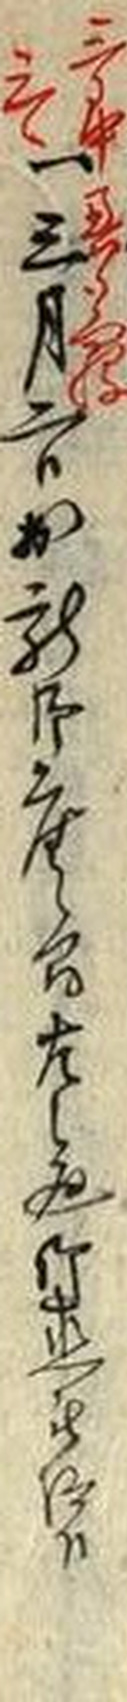一三月二日於新御座之間左之通御直被仰付

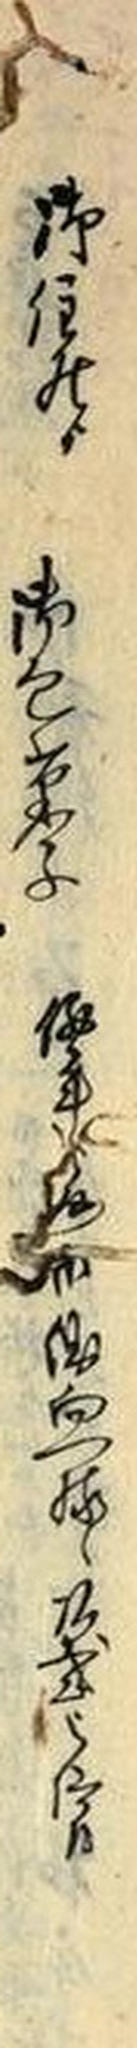御住居ゟ御包菓子例年之通御側向一統へ頂戴被仰付
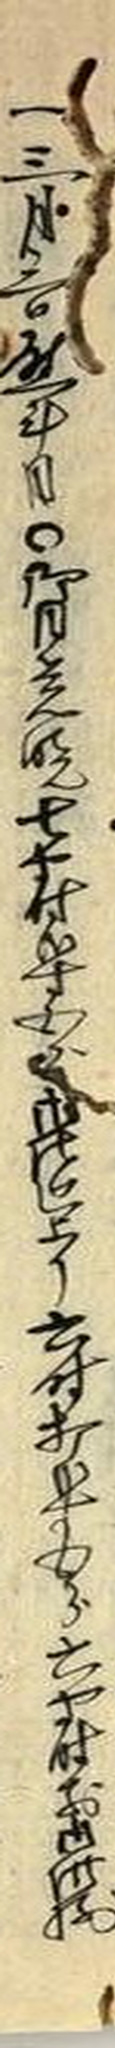一三月三日熨斗目〇御目覚暁七半時弐寸五分御仕廻上り六時打弐寸五分六半時前御供揃
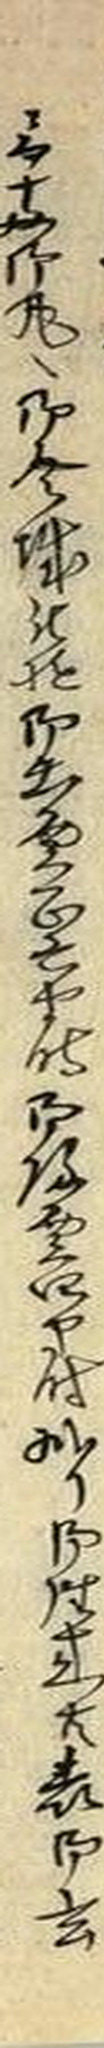ニ而両御丸へ御登城被遊御出殿正六半時御帰殿四半時掛り御往来共表玄
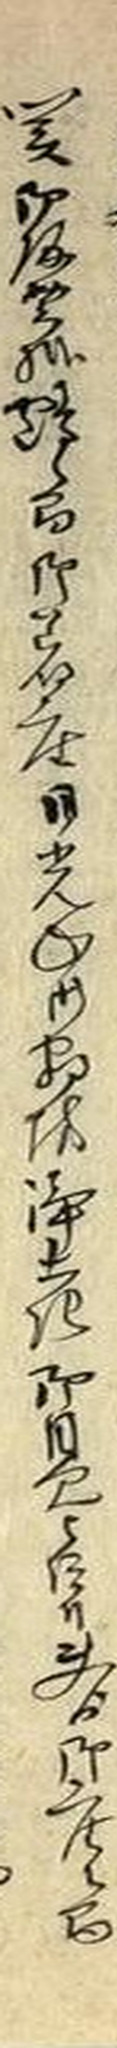関御帰殿掛鶴之間御着座日光山御宿坊浄土院御目見被仰付夫ゟ御座之間
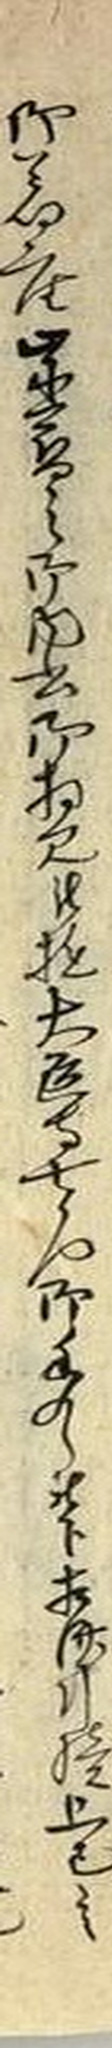御着座歳暮之御内書御拝見被遊大道寺七右衛門御手のし被下相済引続上己之
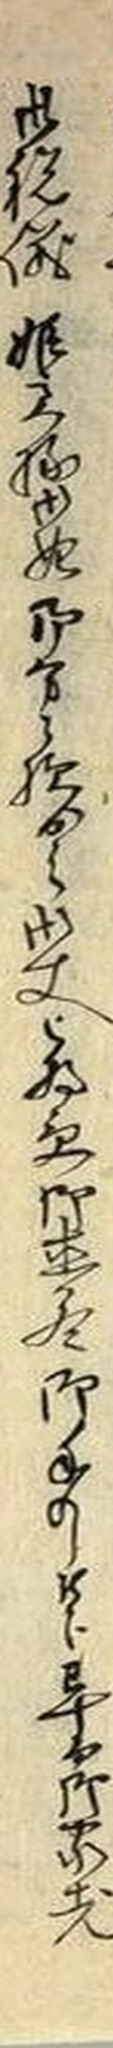御祝儀姫君様御始御方々様ゟ之御使被為受御直答御手のし被下畢而御家老
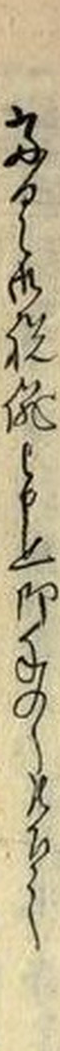当日之御祝儀被申上御手のし被下之
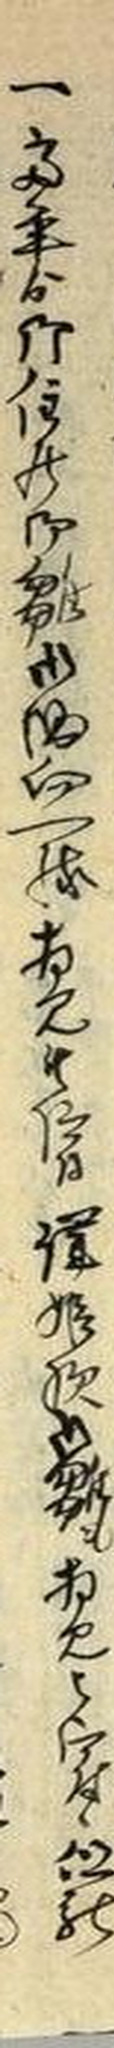一当年ゟ御住居御雛御側向一統拝見被仰付謹姫様御雛も拝見被仰付候但新
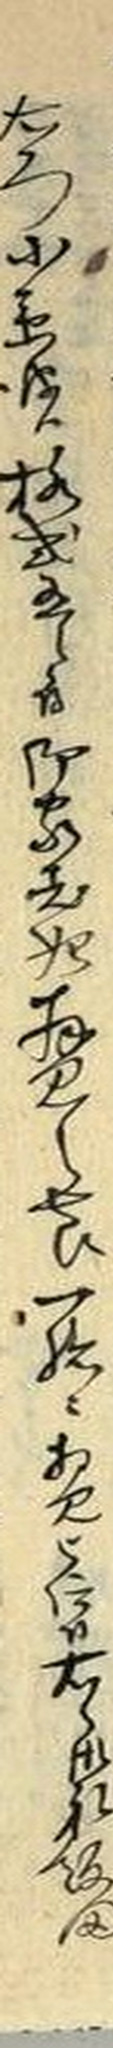右衛門小兵衛ハ格式有之候付御家老始拝見之節一統ニ拝見被仰付右之御礼飯田
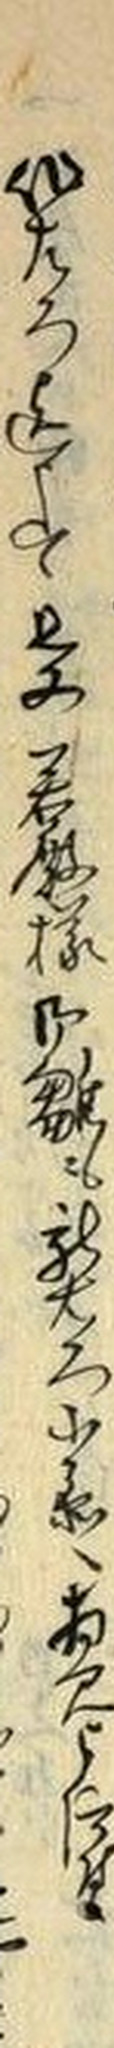作左衛門迄申上候且又若殿様御雛も新右衛門小兵衛へ拝見被仰付候
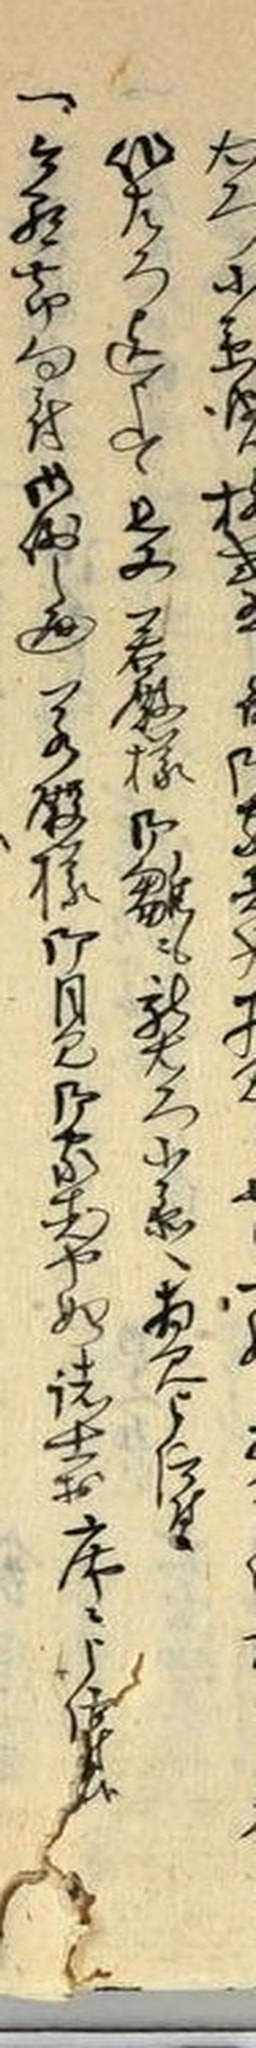一今朝節句ニ付御例之通若殿様御目見御家老中始諸士於席々被仰付候
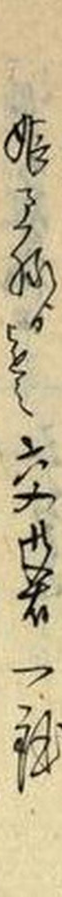姫君様ゟ被進之交御肴一鉢
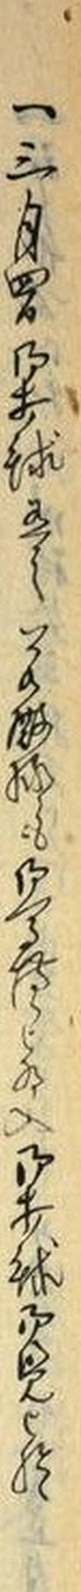一三月四日御打毬有之若殿様も御馬場へ被為入御打毬御覧被遊候
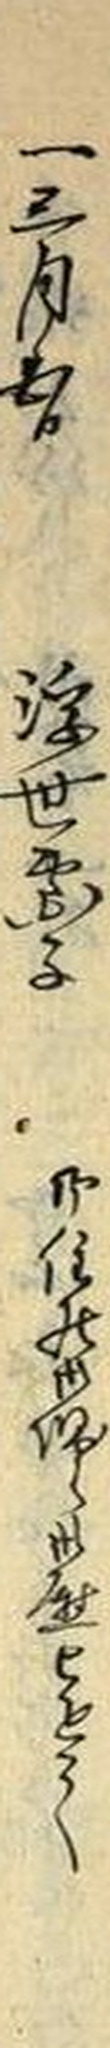一三月五日浮世団子御住居御側へ御慰被進之
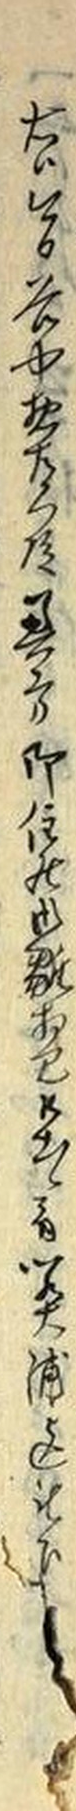右ハ今日谷中惣左衛門殿奥方御住居御雛拝見被出候ニ付美浦迄被下之
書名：少傅日録抄（斉承付側向頭取日記、在府）
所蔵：福井県文書館 Fukui Prefectural Archives
